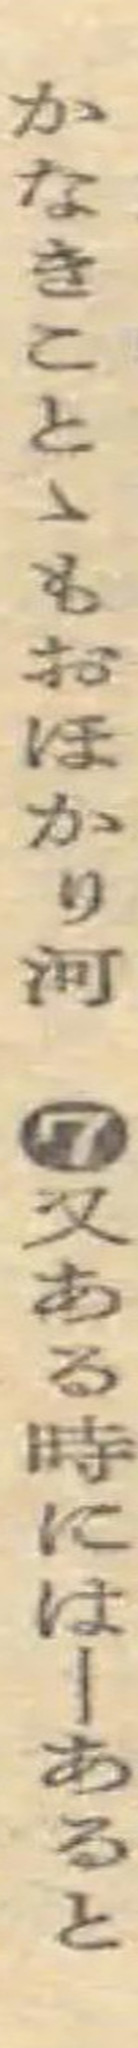かなきことゝもおほかり河❼又ある時には―あると
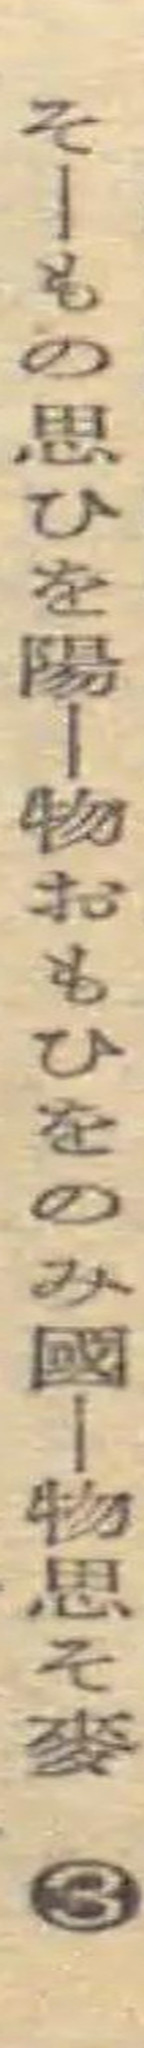そ―もの思ひを陽―物おもひをのみ国―物思そ麦❸
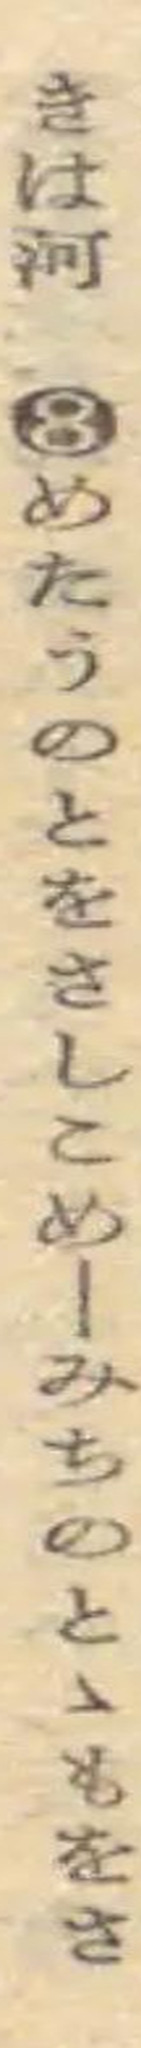きは河❽めたうのとをさしこめ―みちのとゝもをさ
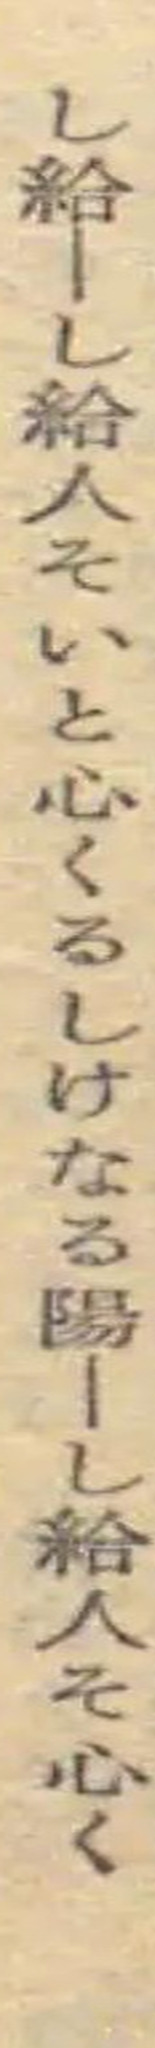し給―し給人そいと心くるしけなる陽―し給人そ心く

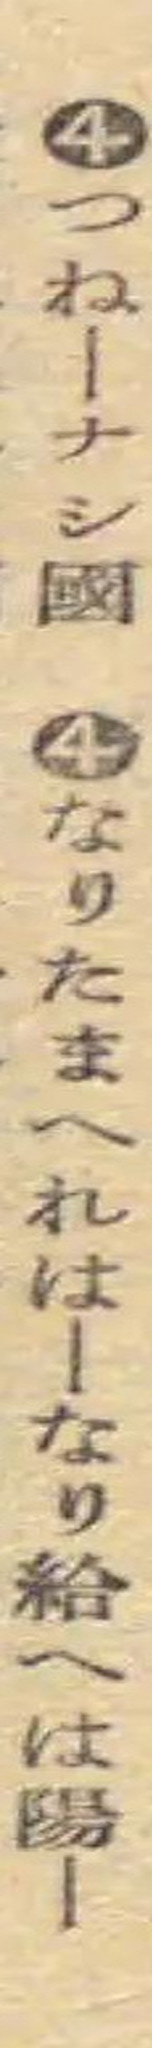❹つね―ナシ国❹なりたまへれは―なり給えは陽―
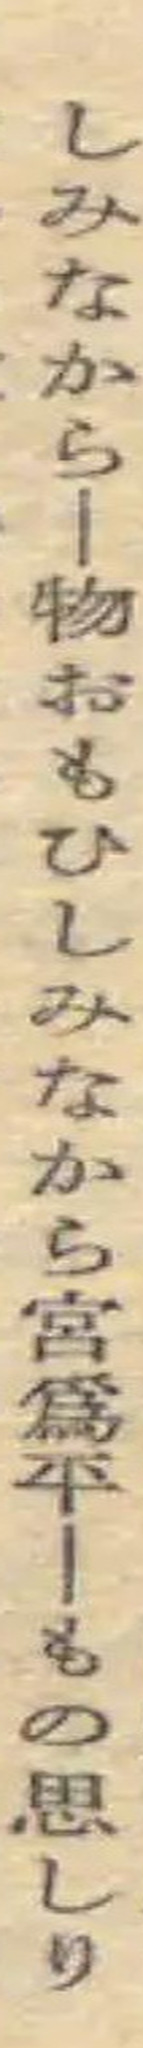しみなから―物おもひしみなから宮為平―もの思しり
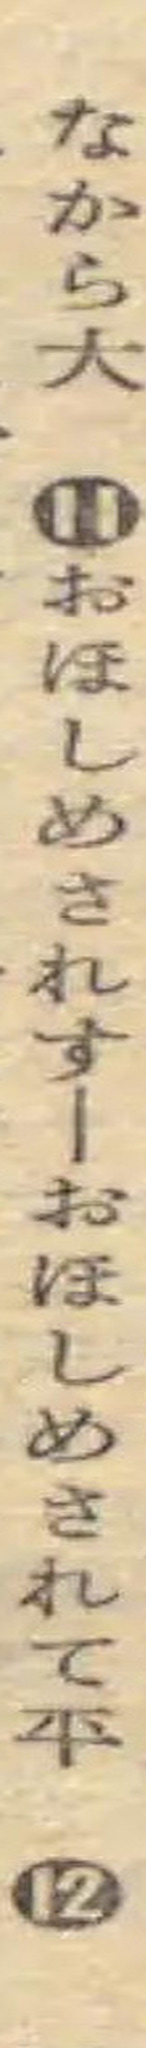なから大⓫おほしめされず―おほしめされて平⓬
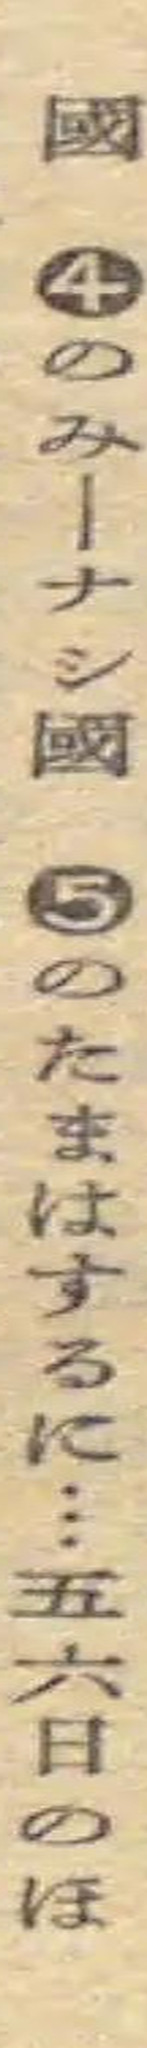国❹のみ―ナシ国❺のたまはするに…五六日のほ
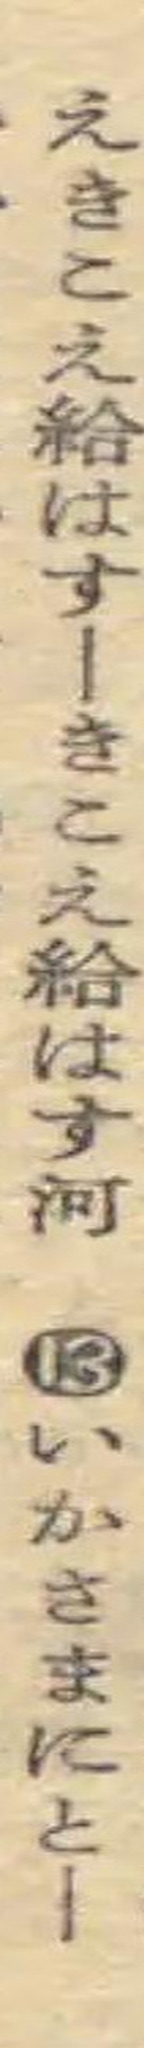えここえ給はす―きこえ給はす河⓭いかさまにと―
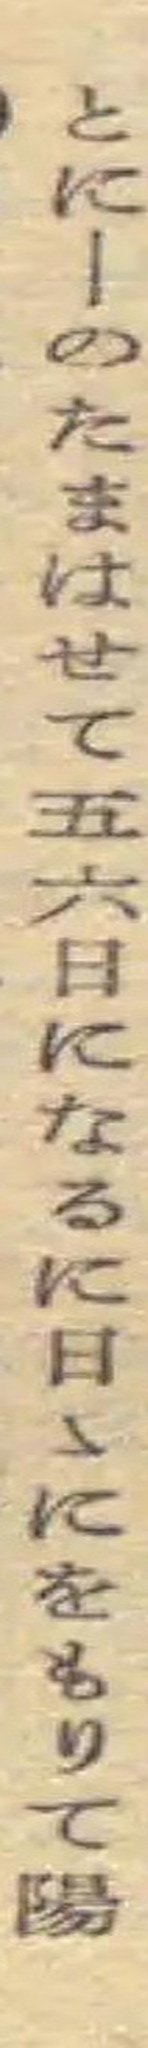とに―のたまはせて五六日になるに日ゝにをもりて陽
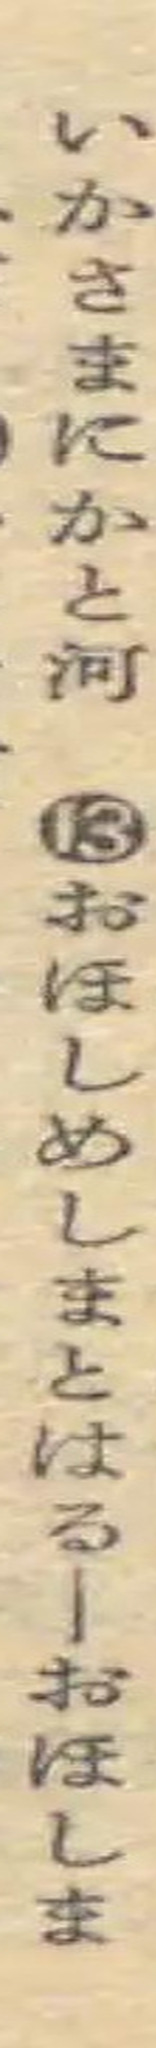いかさまにかと河⓭おほしめしまとはる―おほしま
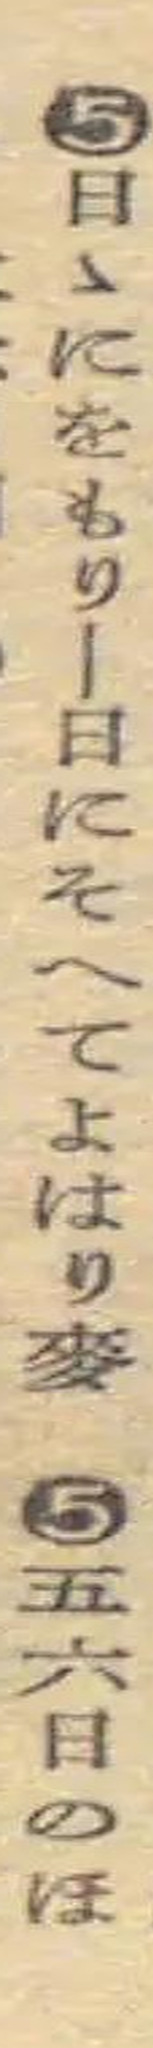❺日ゝにをもり―日にそへてよはり麦❺五六日のほ
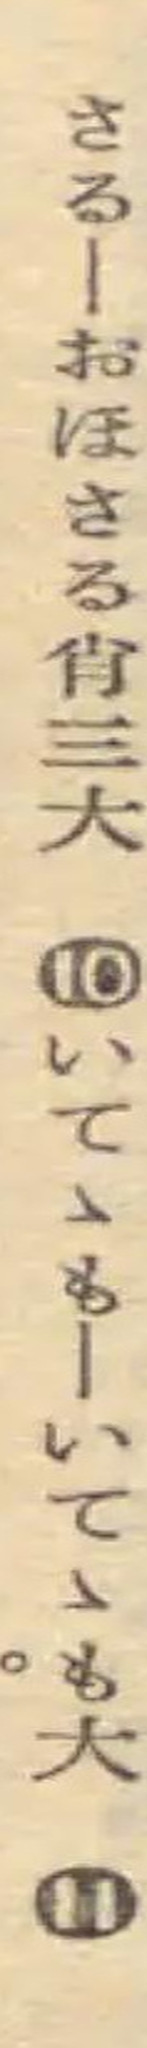さる―おほさる肖三大❿いてゝも―いてゝも大⓫
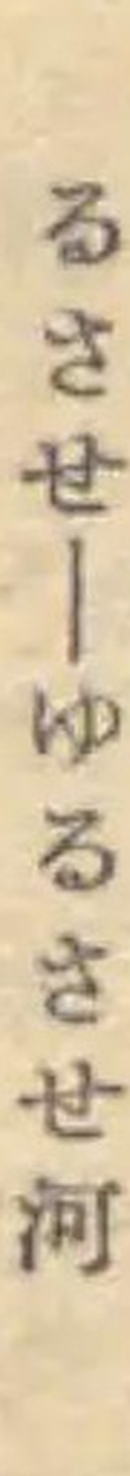るさせ―ゆるさせ河
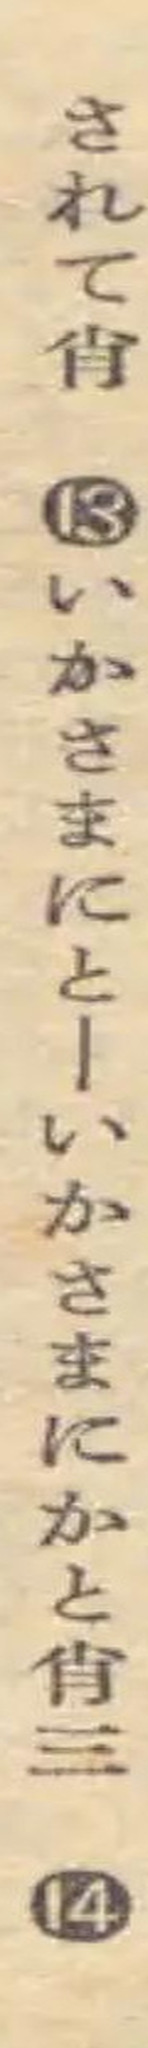されて肖⓭いかさまにと―いかさまにかと肖三⓮
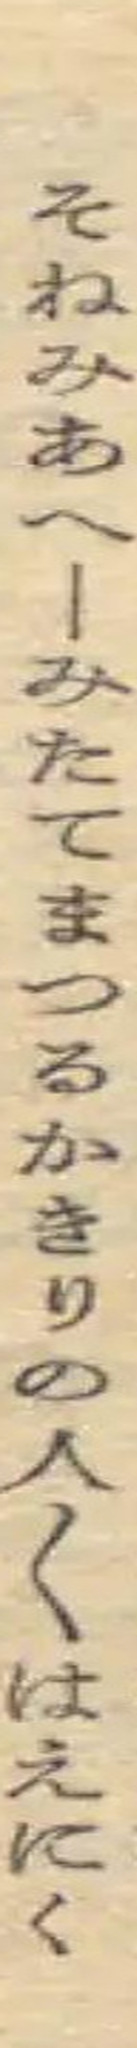そねみあへ―みたてまつるかきりの人〳〵はえにく
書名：校異源氏物語.
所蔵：国立国会図書館 National Diet Library, JAPAN
